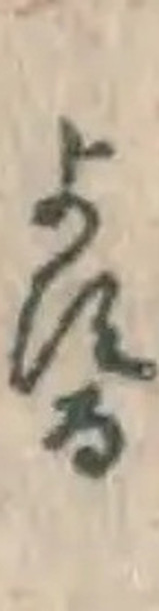よする

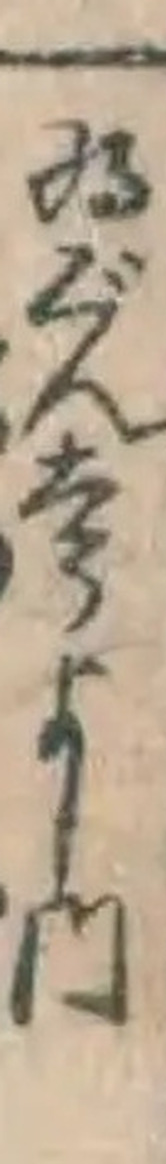将ぐん太郎よし門
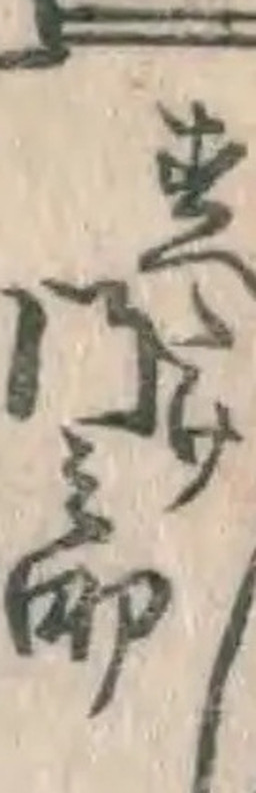門之助
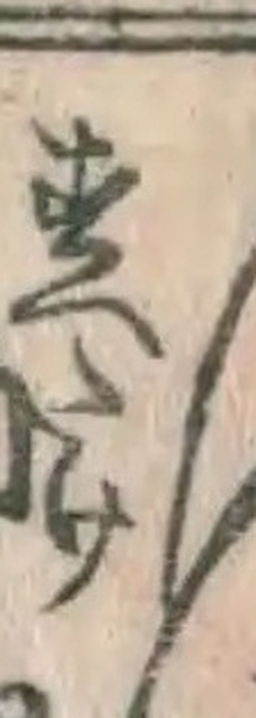すへたけ
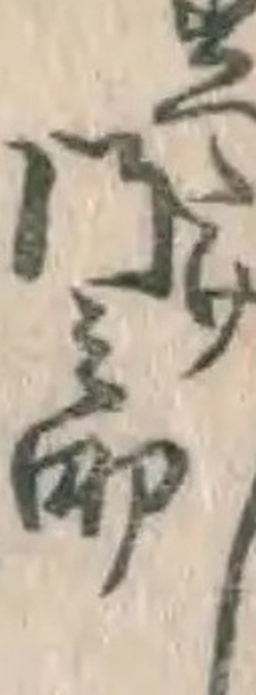門之助
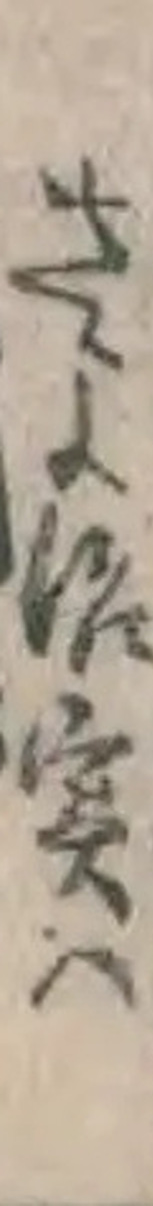さよ浪実は
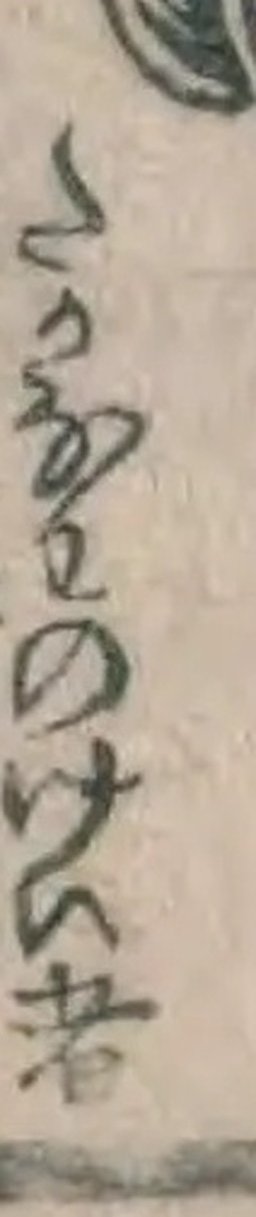たかなわのけい者
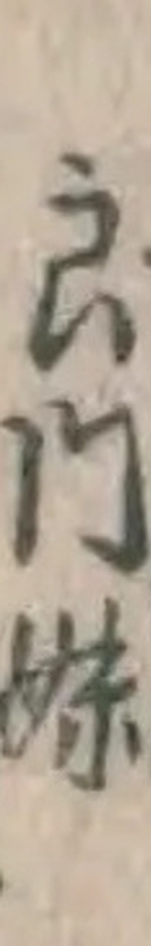良門妹
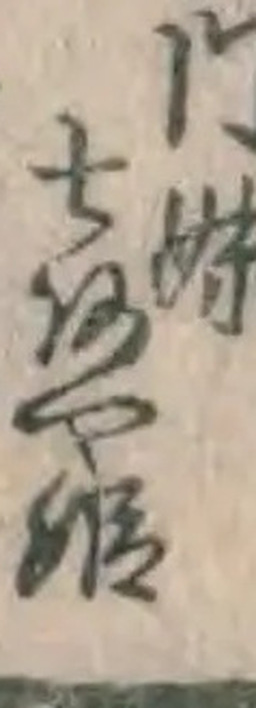七あや姫
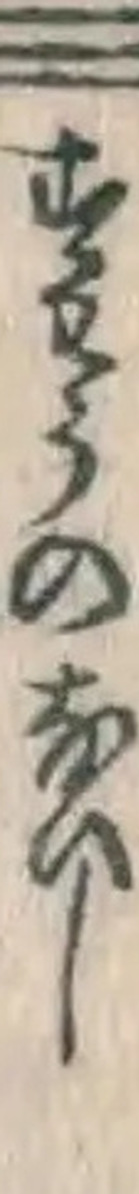すわうのないし
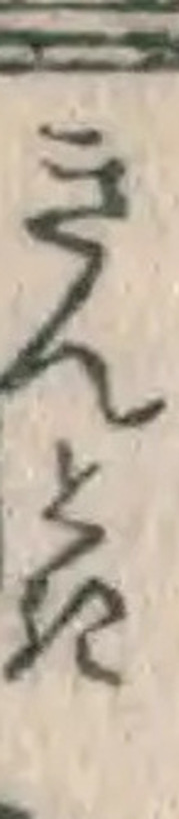きんとき
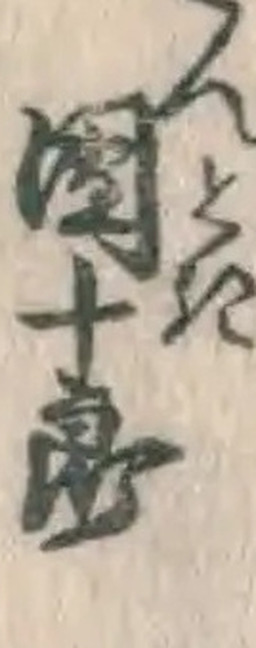団十郎
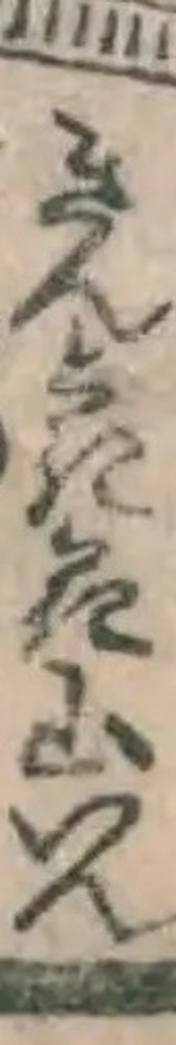きんとき花山いん
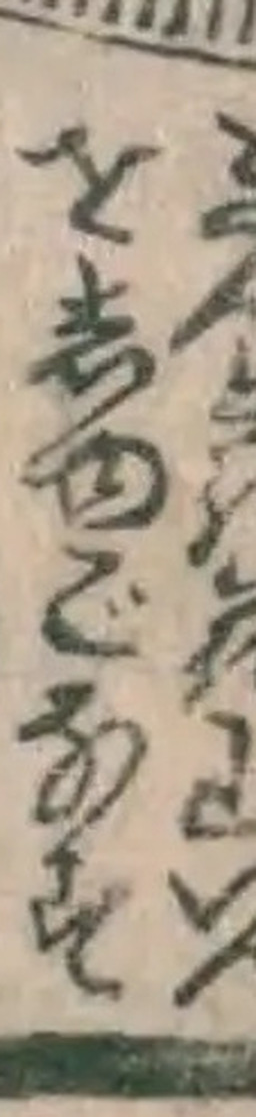をしゆごなす
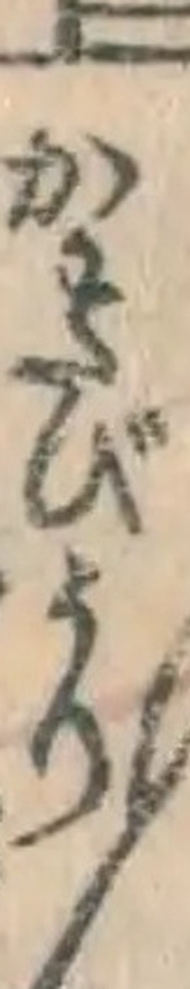かわたびうり
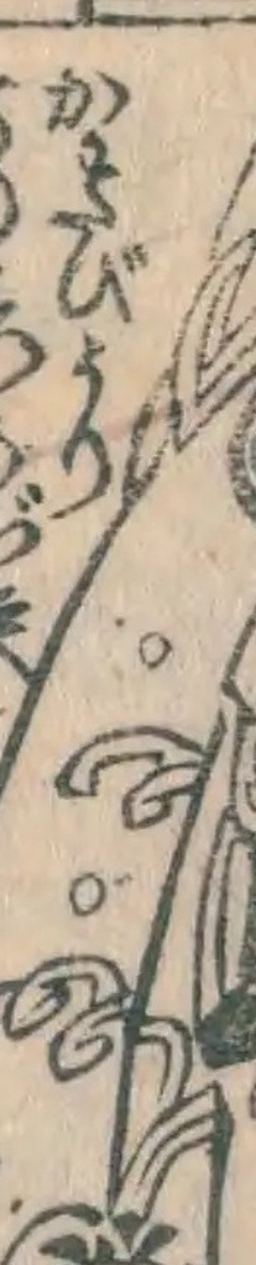かわたびうり
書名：四天王宿直着綿
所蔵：国立国会図書館 National Diet Library, JAPAN
